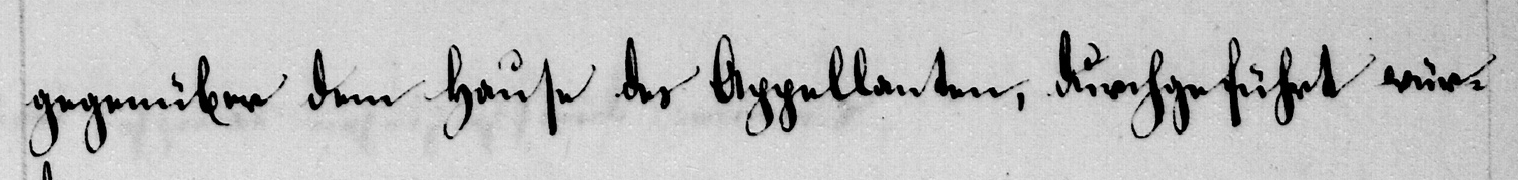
gegenüber dem Hause des Appellanten, durchgeführt wür¬
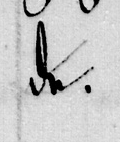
de.
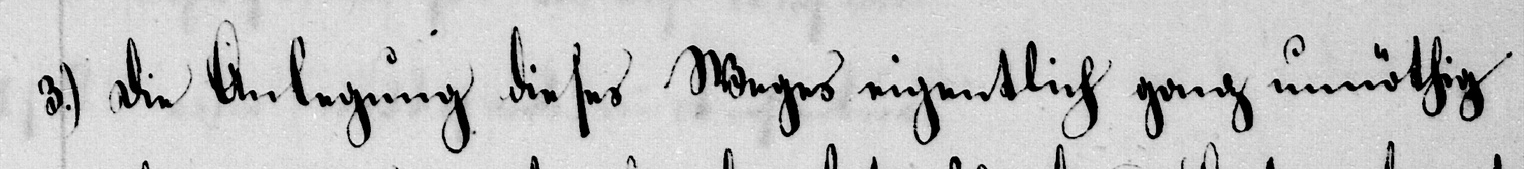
3.) Die Anlegung dieses Weges eigentlich ganz unnöthig
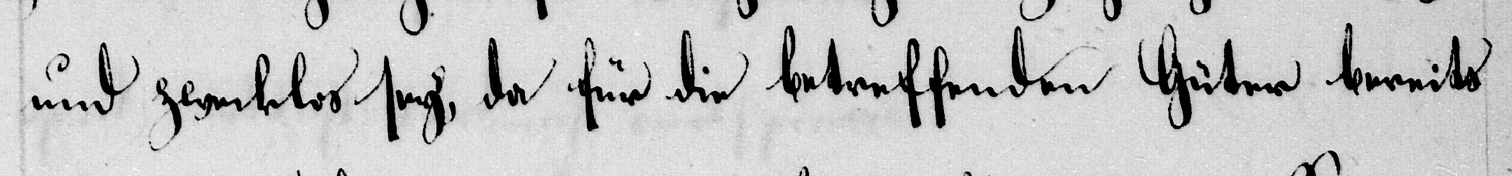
und zwecklos sey, da für die betreffenden Güter bereits
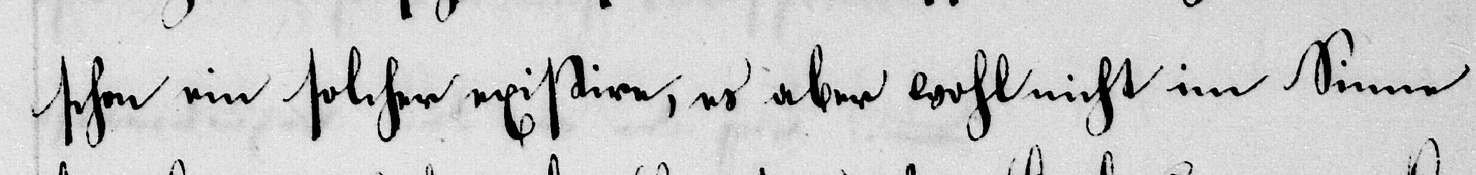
schon ein solcher existire, es aber wohl nicht im Sinne
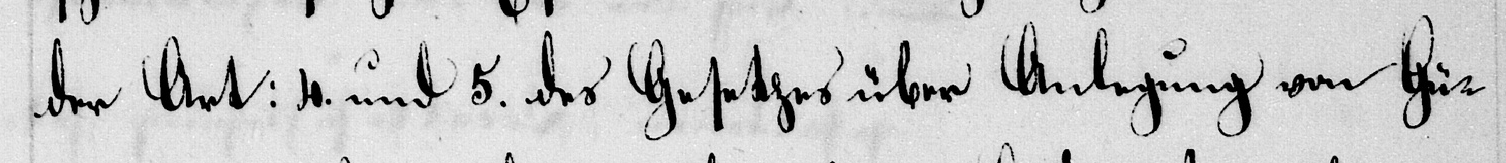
der Art: 4. und 5. des Gesetzes über Anlegung von Gü¬
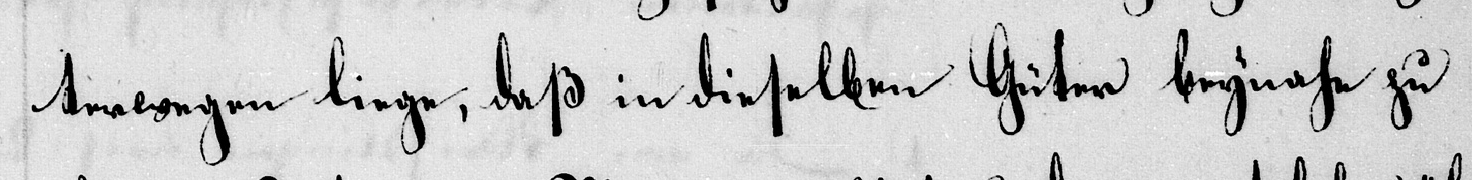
terwegen liege, daß in dieselben Güter beynahe zu
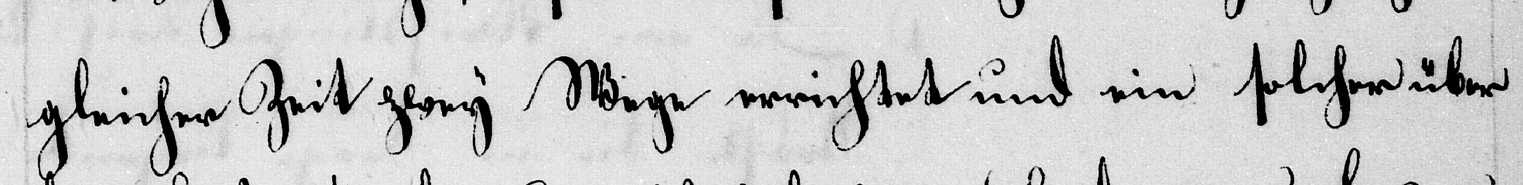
gleicher Zeit zwey Wege errichtet und ein solcher über
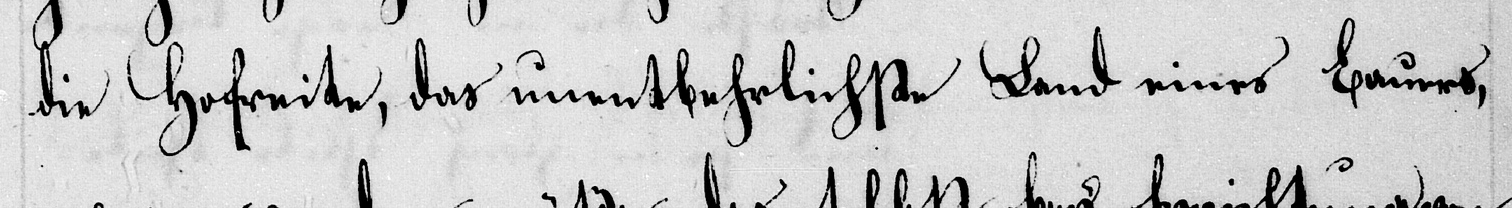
die Hofreite, das unentbehrlichste Land eines Bauers,
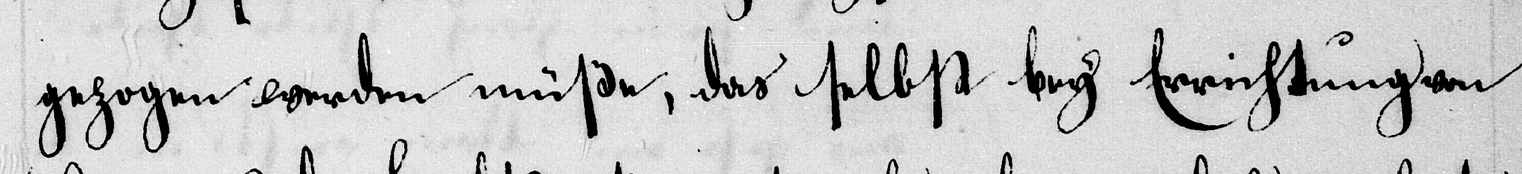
gezogen werden müße, das selbst bey Errichtung von
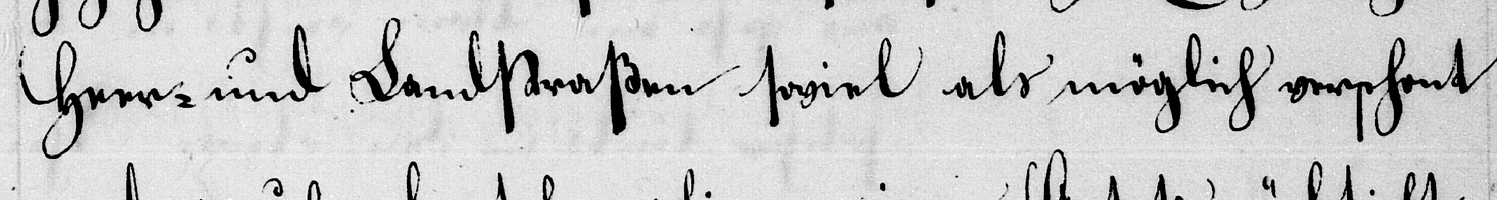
Heer- und Landstraßen soviel als möglich verschont
